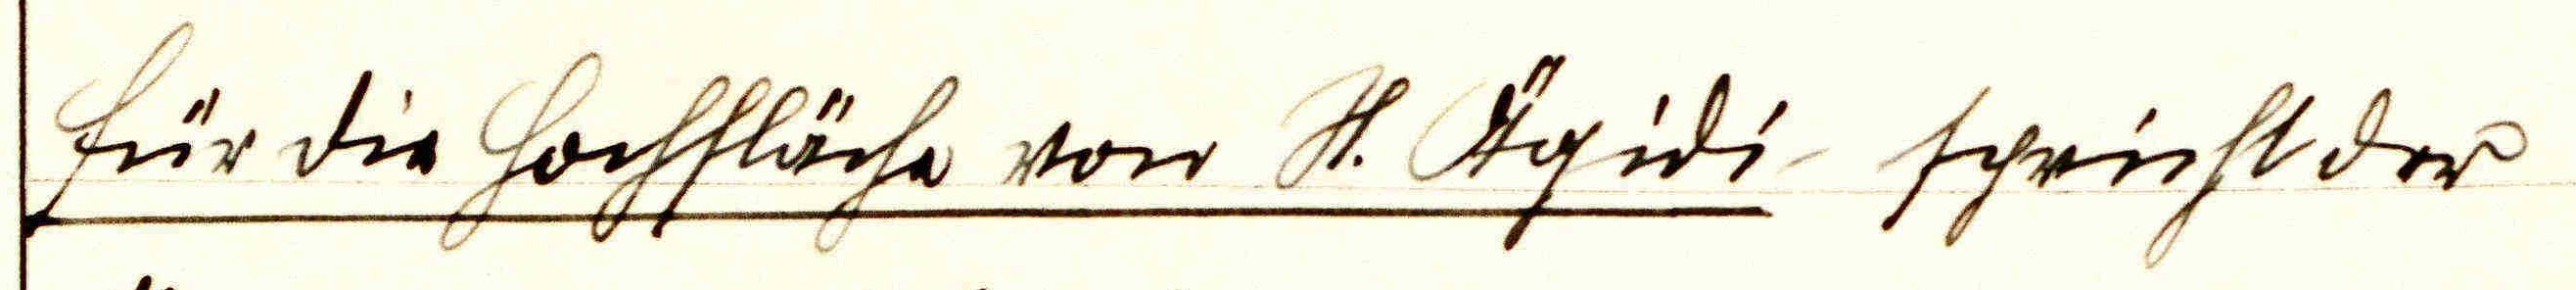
Für die Hochfläche von St. Ägidi spricht der
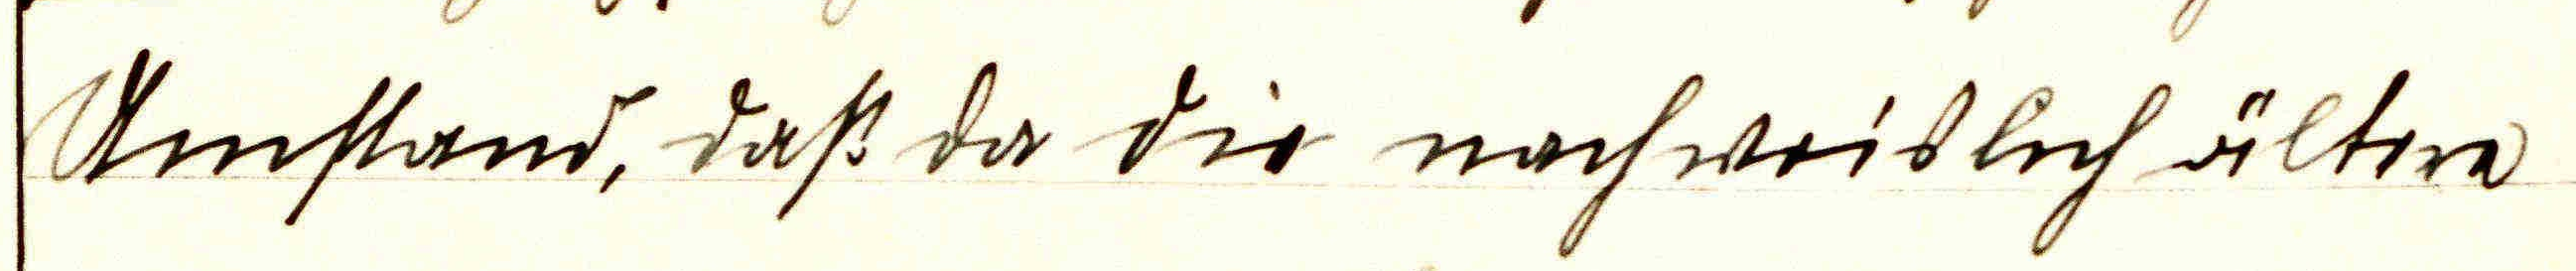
Umstand, daß da die nachweislich ältere
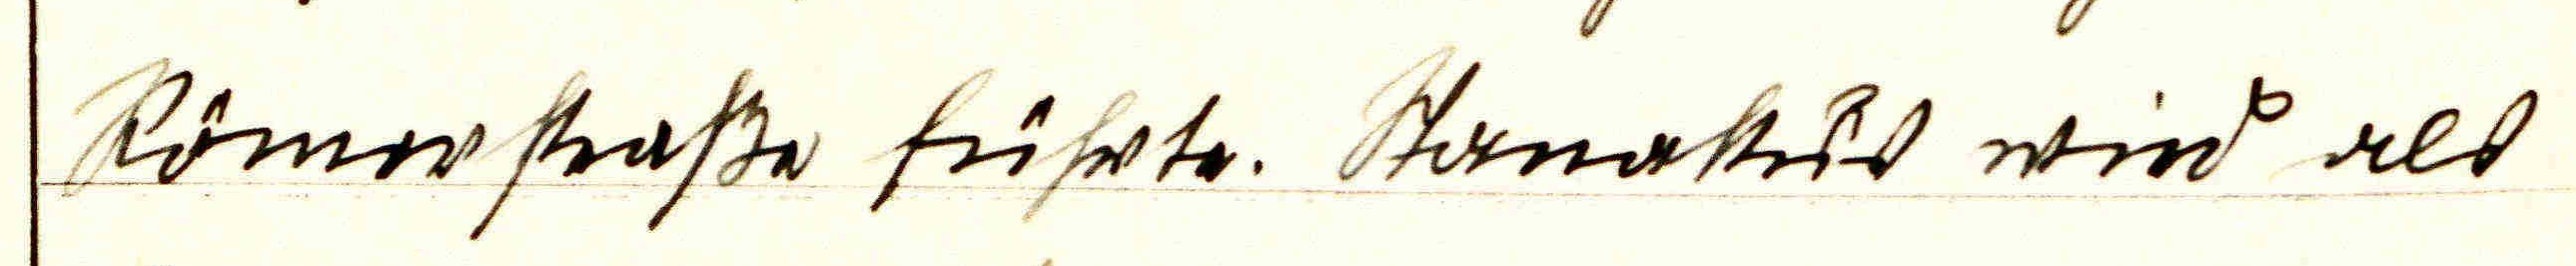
Römerstraße führte. Stanakus wird als
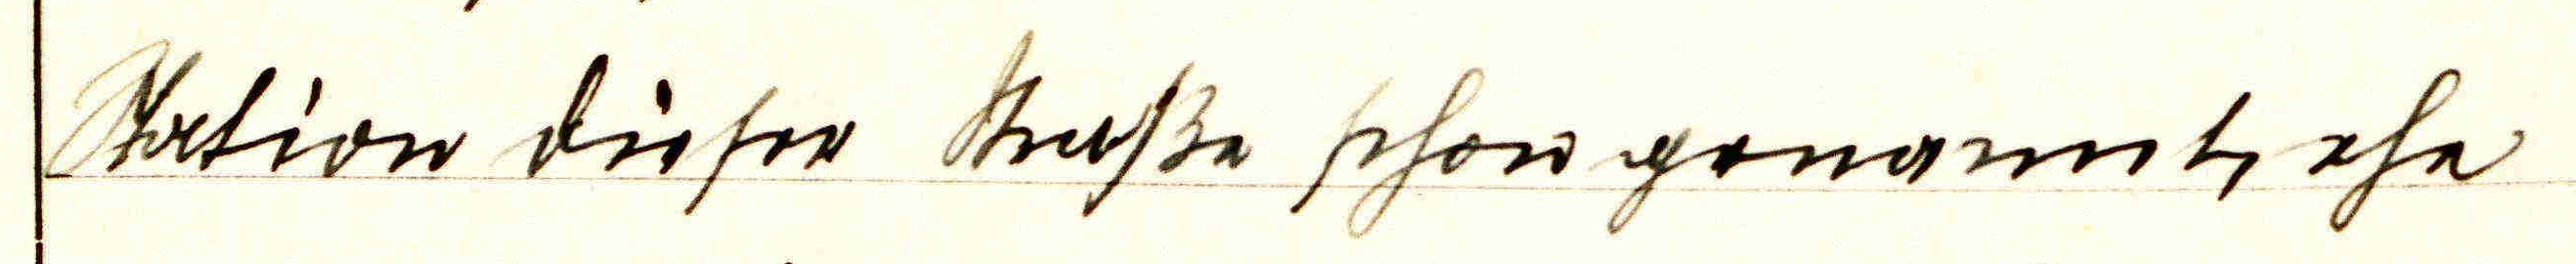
Station dieser Straße schon genannt, ehe
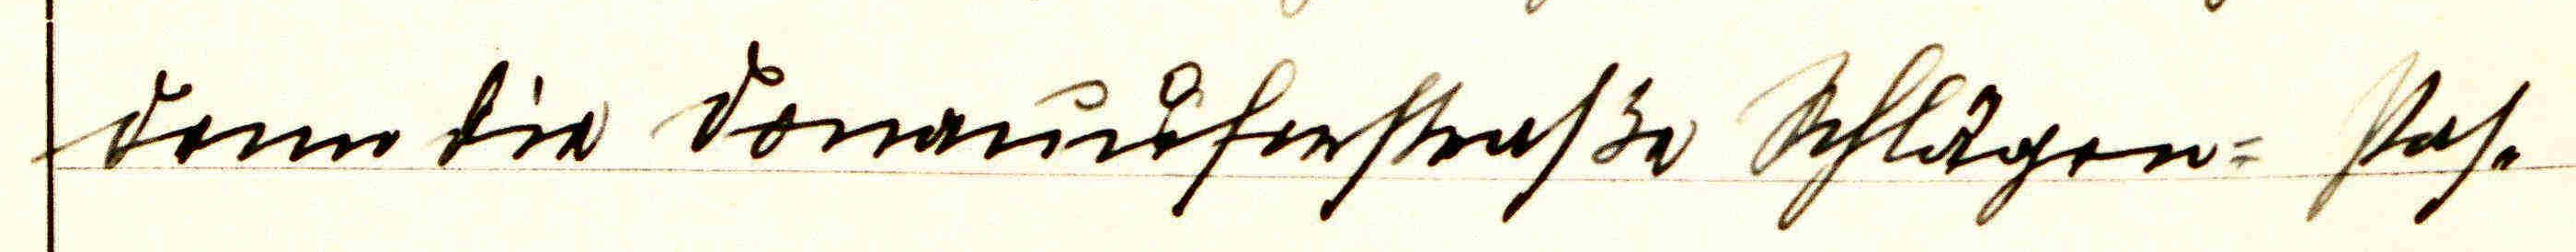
dann die Donauuferstraße Schlägen-Pas-
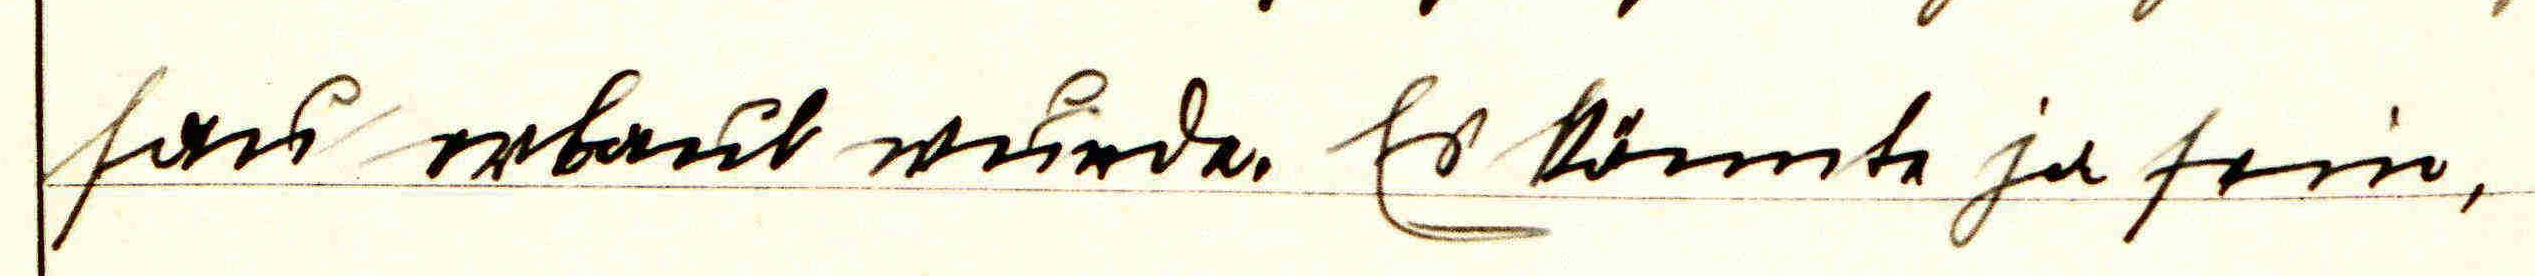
sau erbaut wurde. Es könnte ja sein,
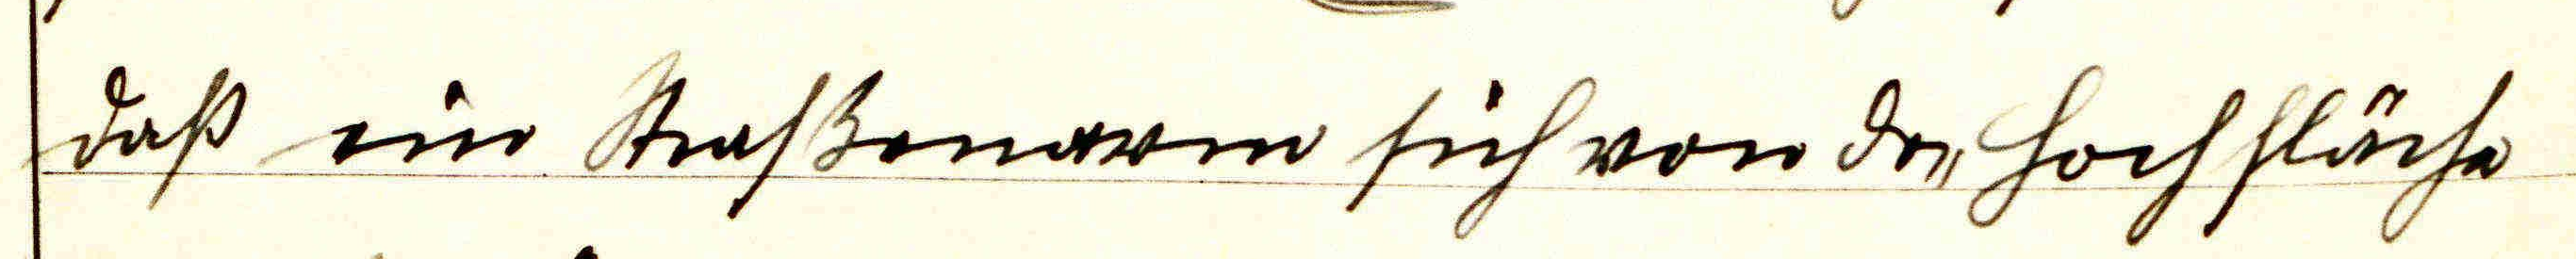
daß ein Straßenarm sich von der Hochfläche
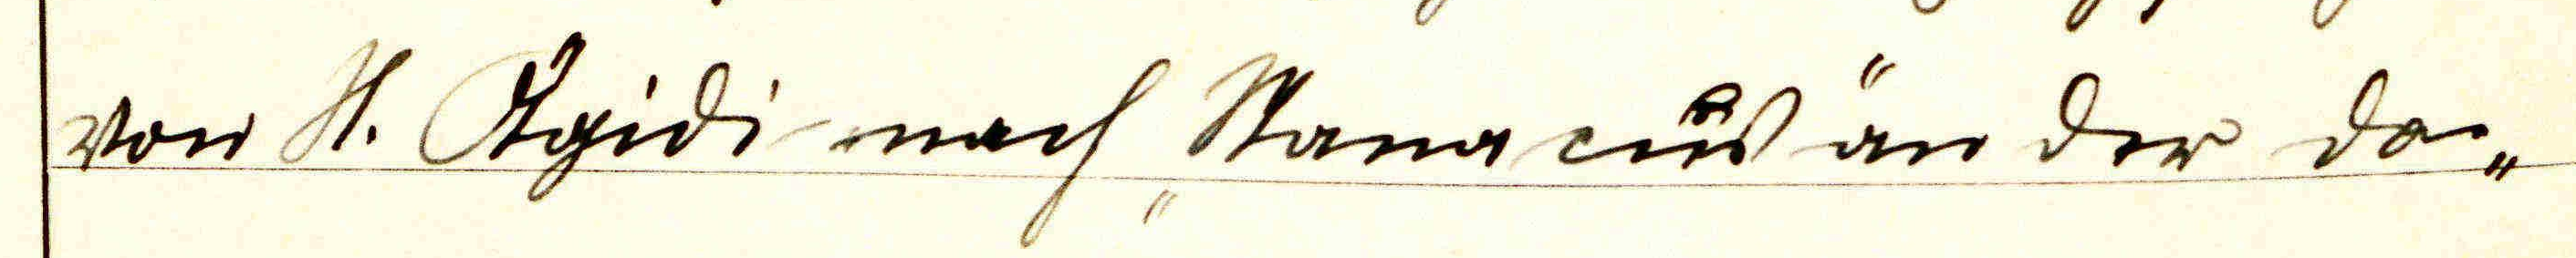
von St. Ägidi nach Stanacus an der Do-
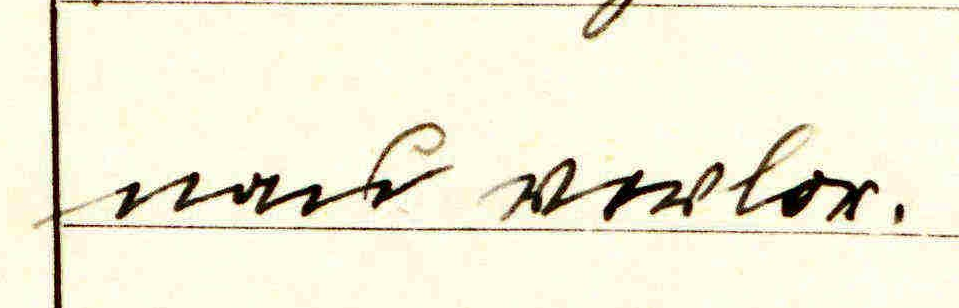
nau verlor.
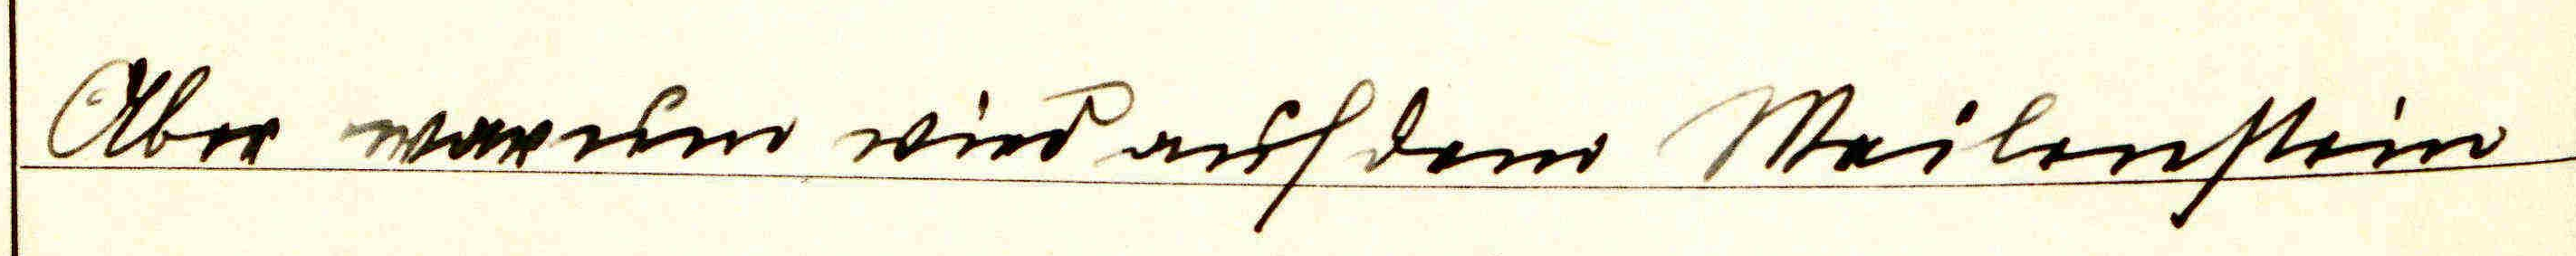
Aber warum wird auf dem Meilenstein
